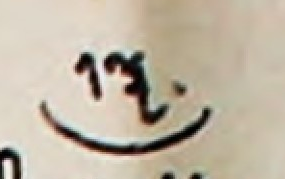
17.
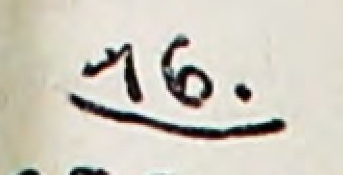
16.
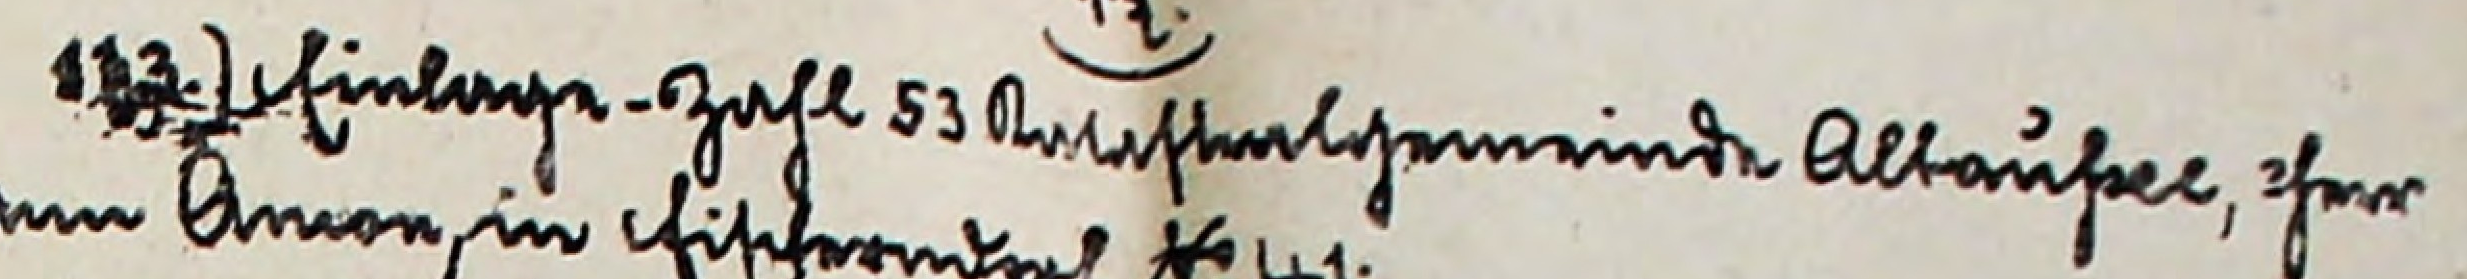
133.) Einlage - Zahl 53 Katastralgemeinde Altaussee, Herr
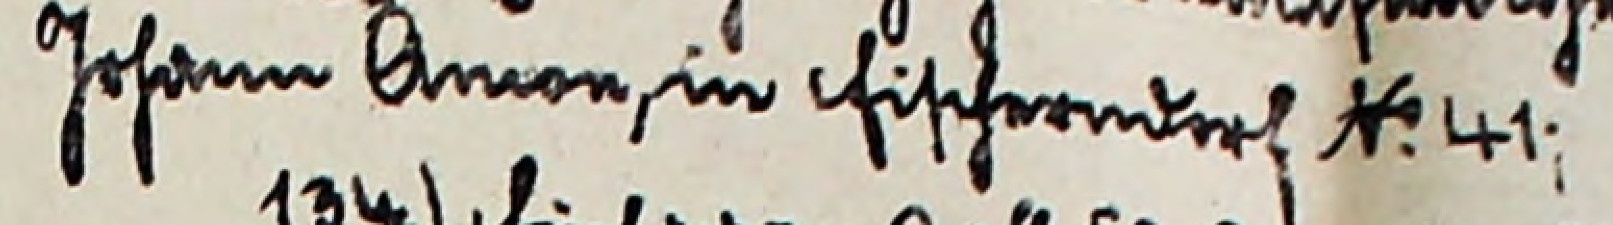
Johann Amon, in Fischerndorf № 41;
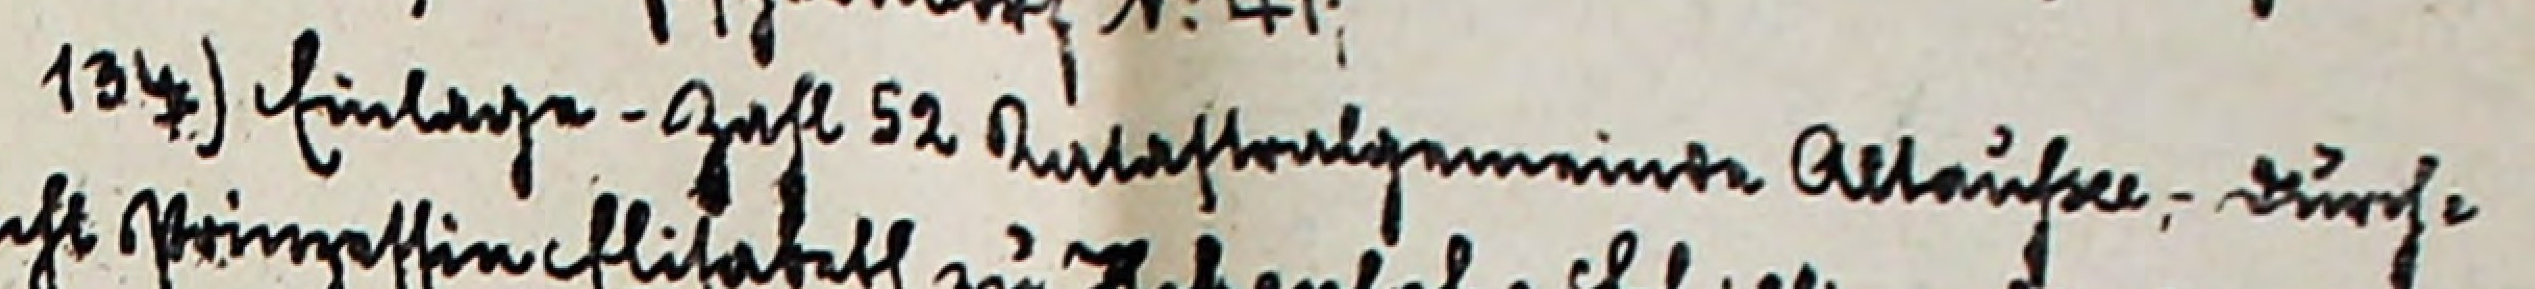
134.) Einlage - Zahl 52 Katastralgemeinde Altaussee, - durch=
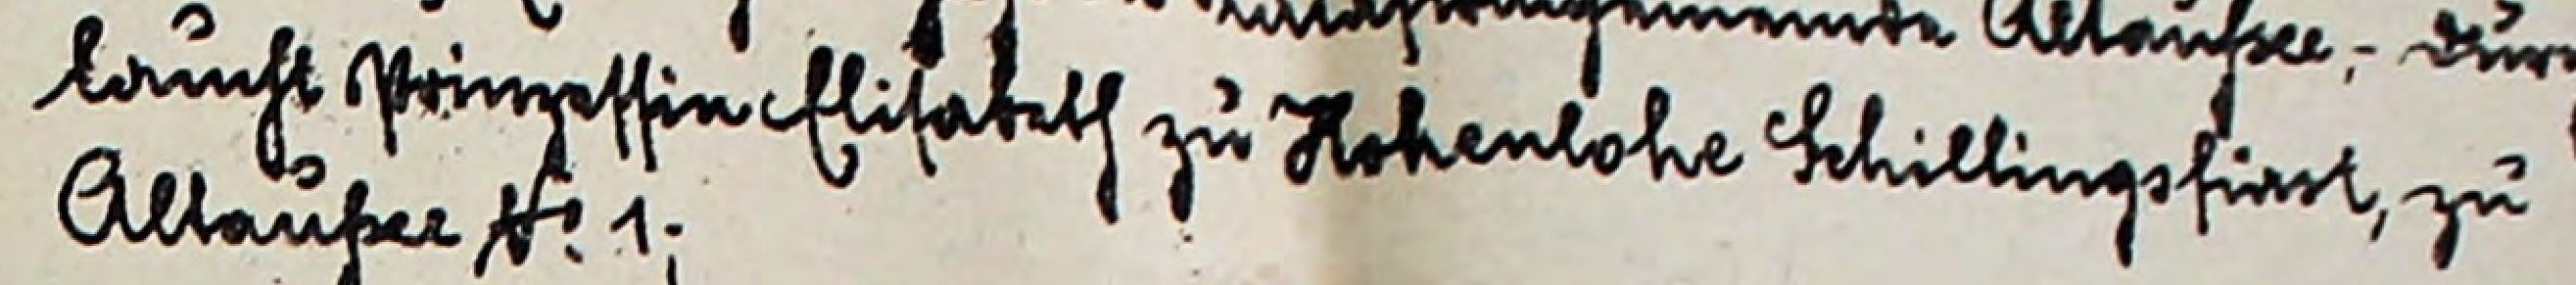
laucht Prinzessin Elisabeth zu Hohenlohe Schillingsfürst, zu
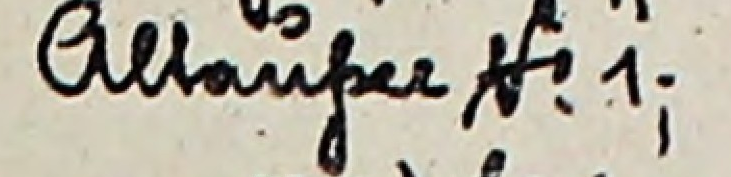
Altaussee № 1;
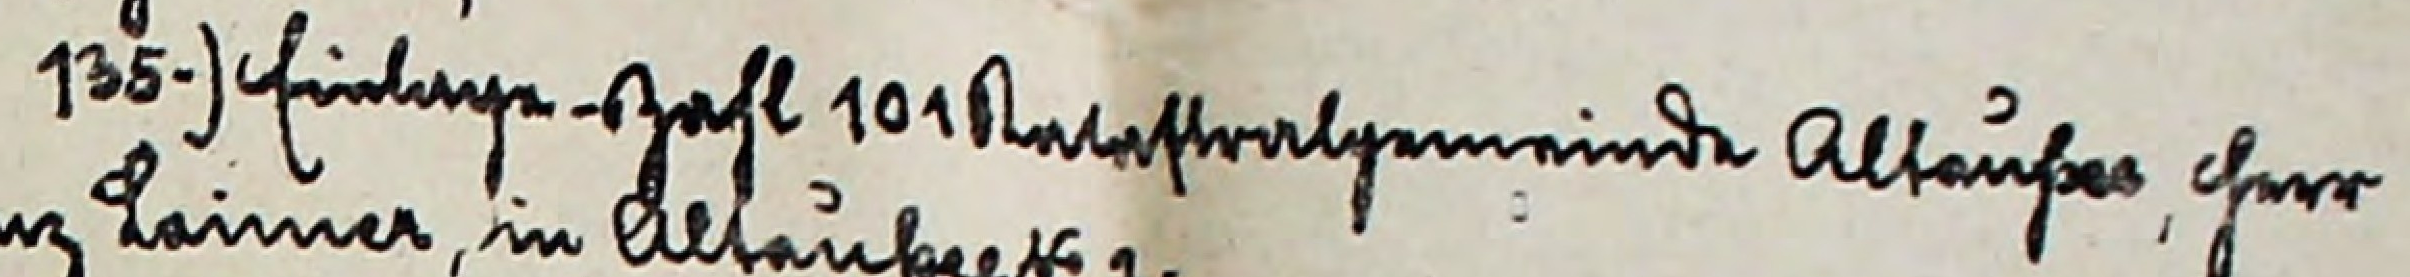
135.) Einlage - Zahl 101 Katastralgemeinde Altaussee, Herr
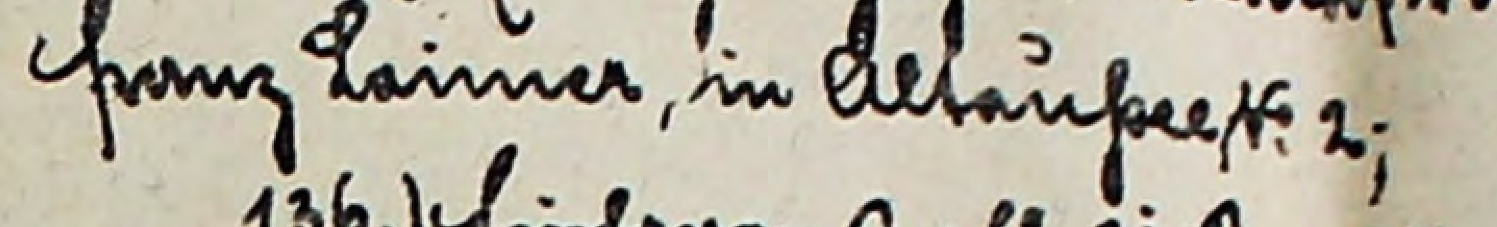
Franz Laimer, in Altaussee № 2;
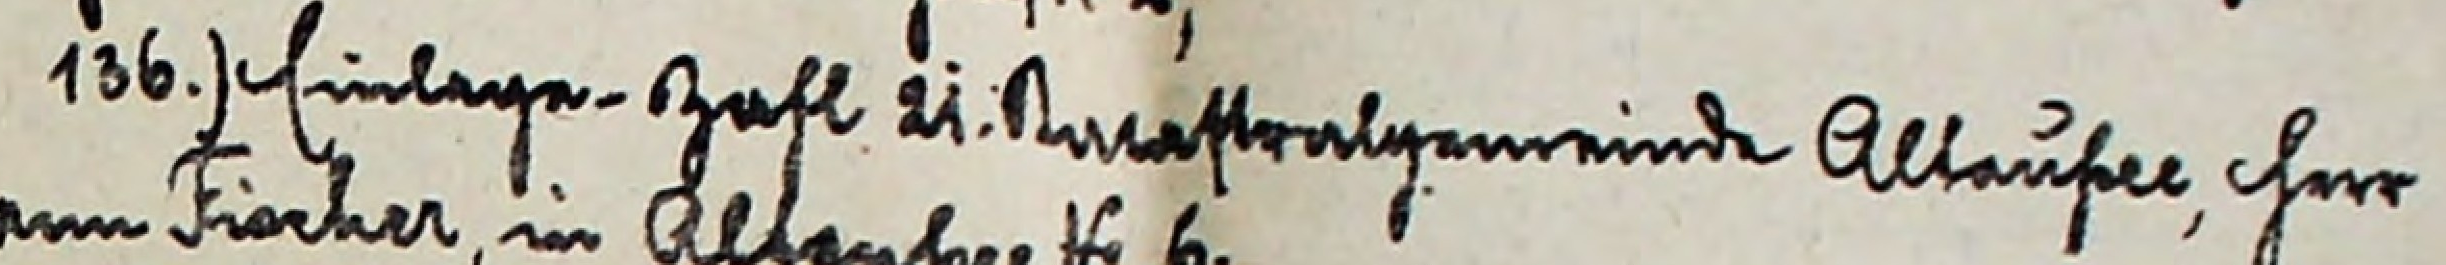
136.) Einlage - Zahl 21. Katastralgemeinde Altaussee, Herr
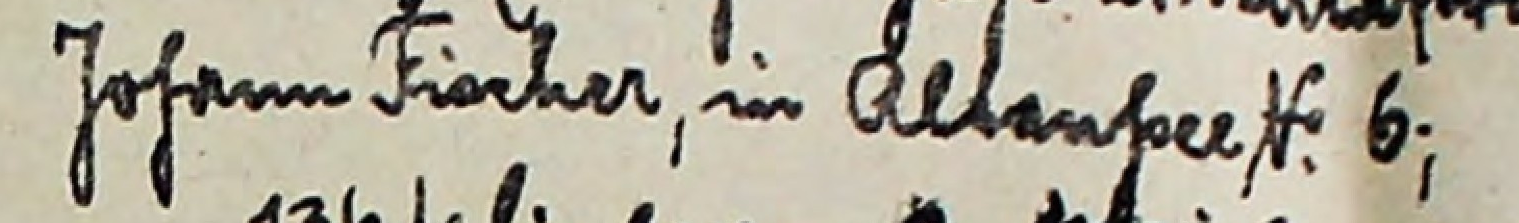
Johann Fischer, in Altaussee № 6;
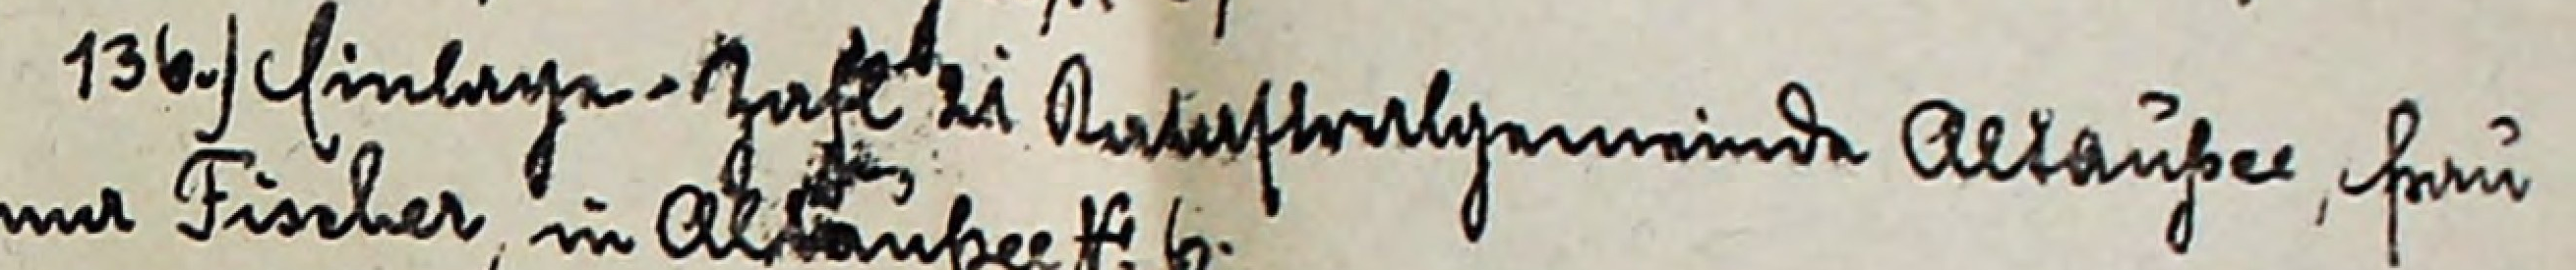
136.) Einlage - Zahl 21 Katastralgemeinde Altaussee, Frau
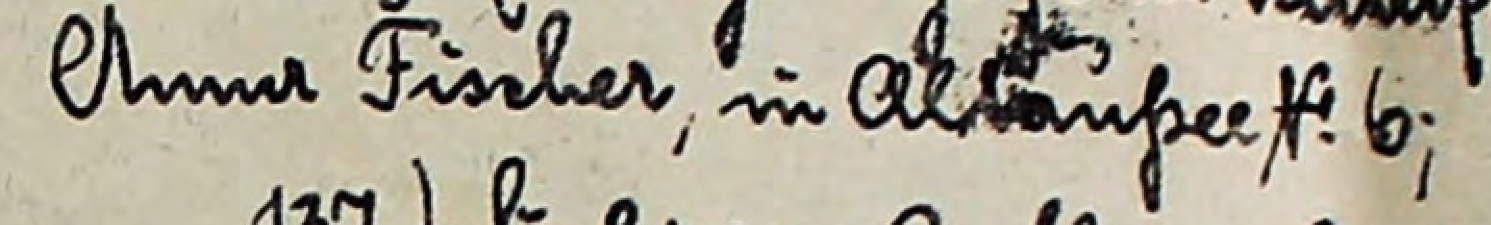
Anna Fischer, in Altaussee № 6;
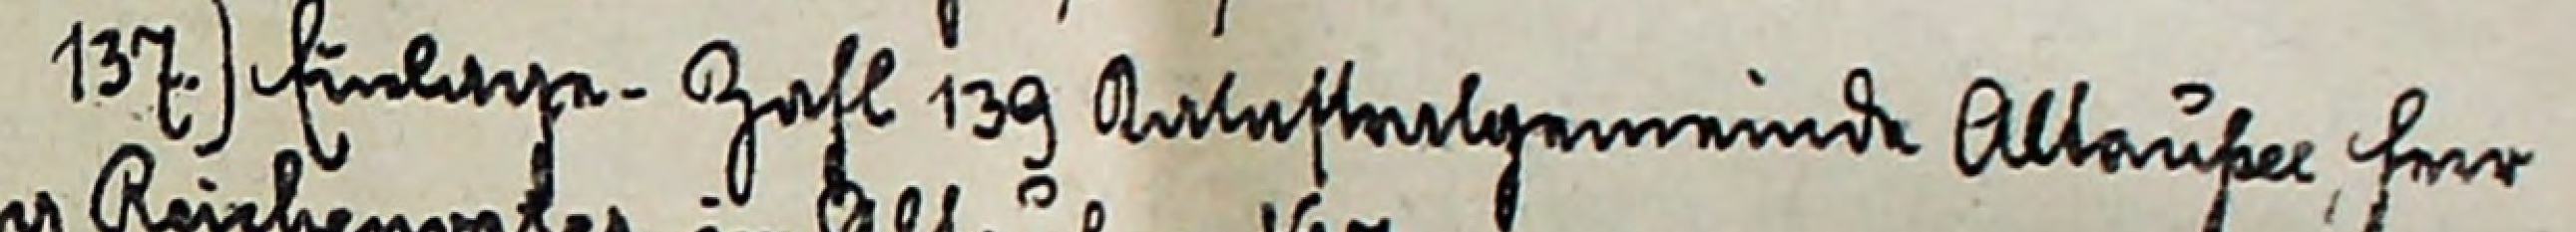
137.) Einlage - Zahl 139 Katastralgemeinde Altaussee, Herr
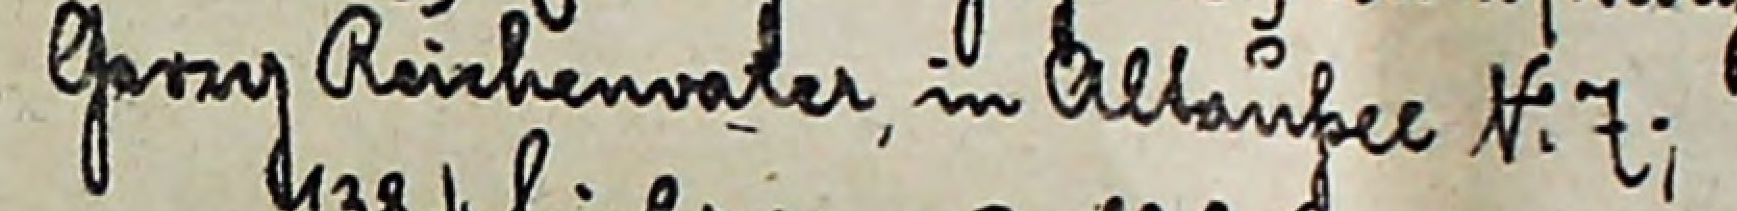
Georg Reichenvater, in Altaussee № 7;
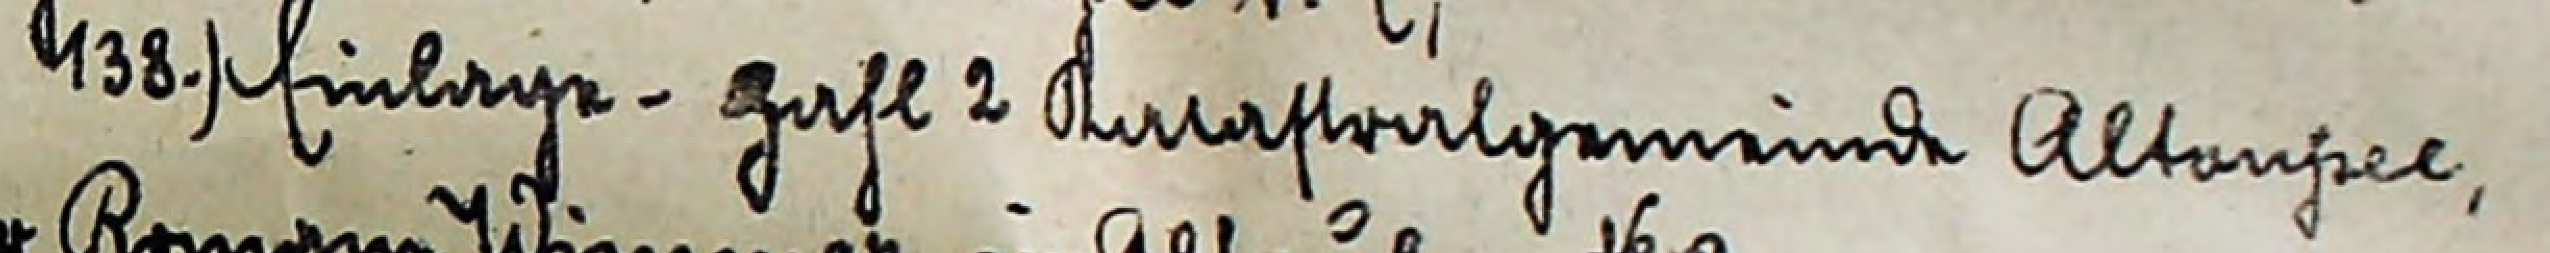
138.) Einlage - Zahl 2 Katastralgemeinde Altaussee,
